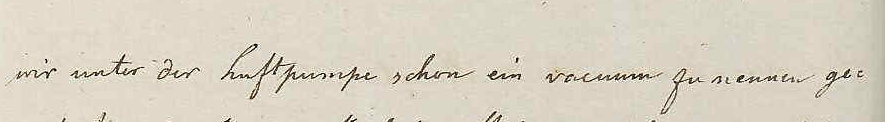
wir unter der Luftpumpe schon ein vacuum zu nennen ge-
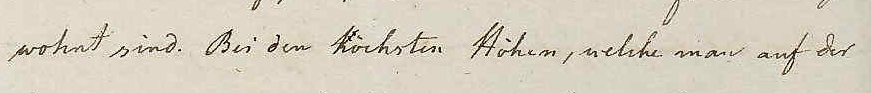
wohnt sind. Bei den höchsten Höhen, welche man auf der
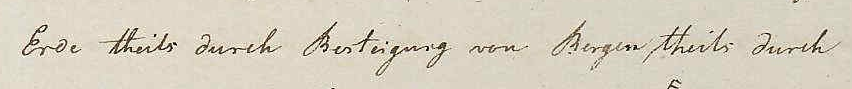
Erde theils durch Besteigung von Bergen theils durch
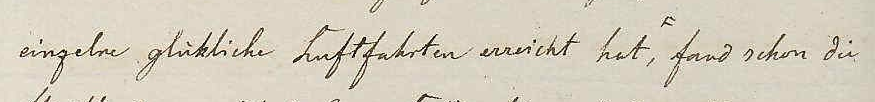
einzelne glükliche Luftfahrten erreicht hat, fand schon die
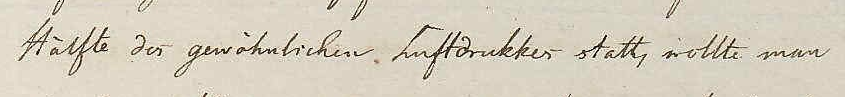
Hälfte des gewöhnlichen Luftdrukkes statt, wollte man
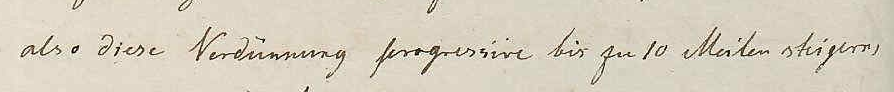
also diese Verdünnung progressive bis zu 10 Meilen steigern,
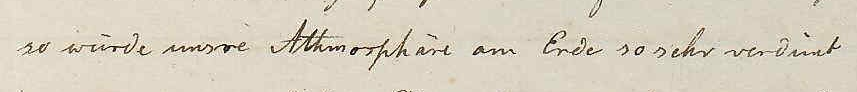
so würde unsre Athmosphäre am Ende so sehr verdünt
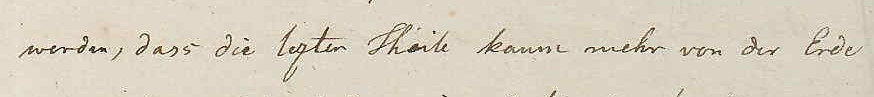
werden, dass die lezten Theile kaum mehr von der Erde
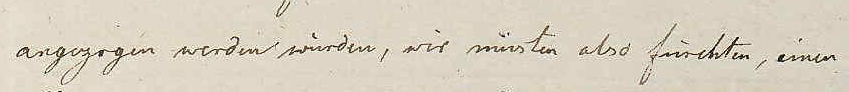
angezogen werden würden, wir müsten also fürchten, einen
